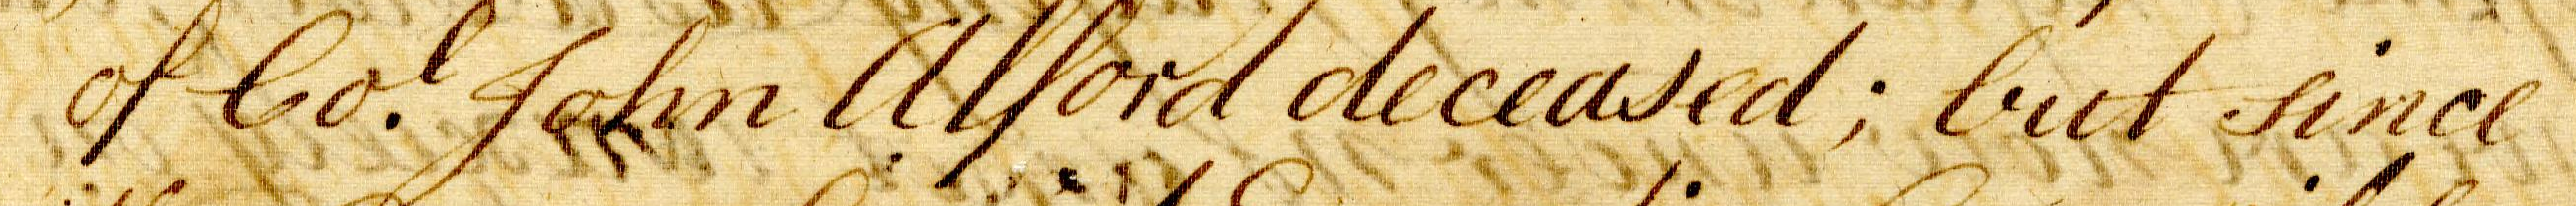of Co^l. John Alford deceased; but since
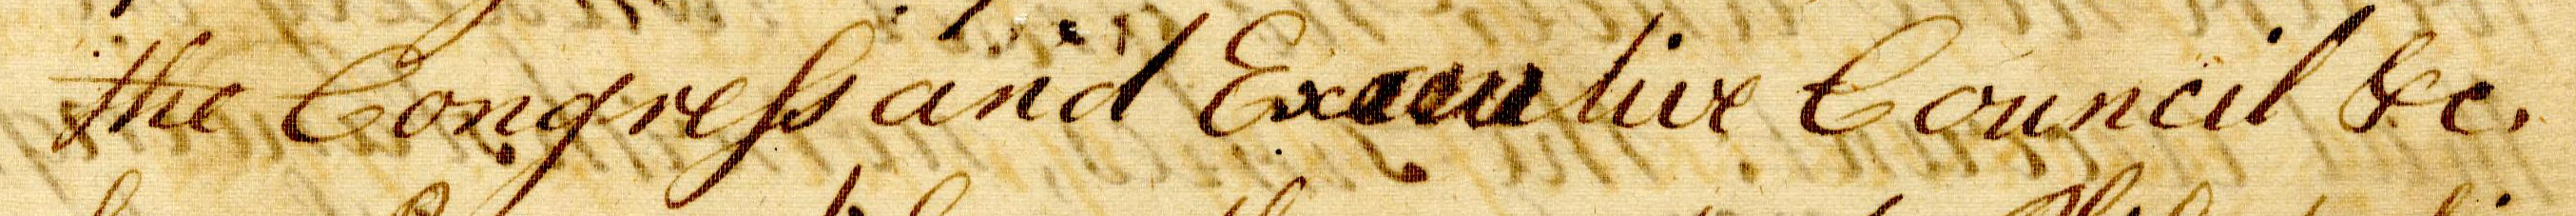the Congress and Executive Council &c,
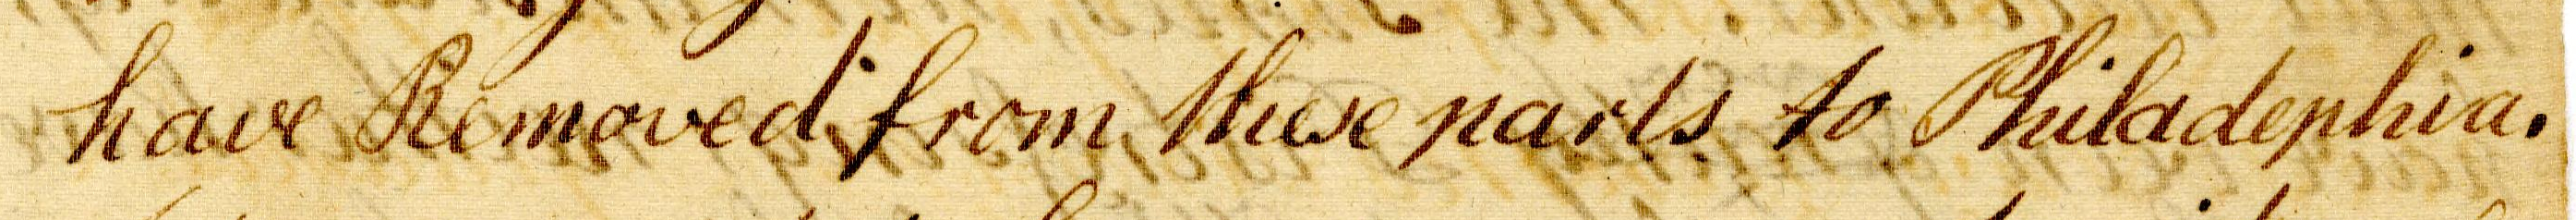have Removed from these parts to Philadelphia,
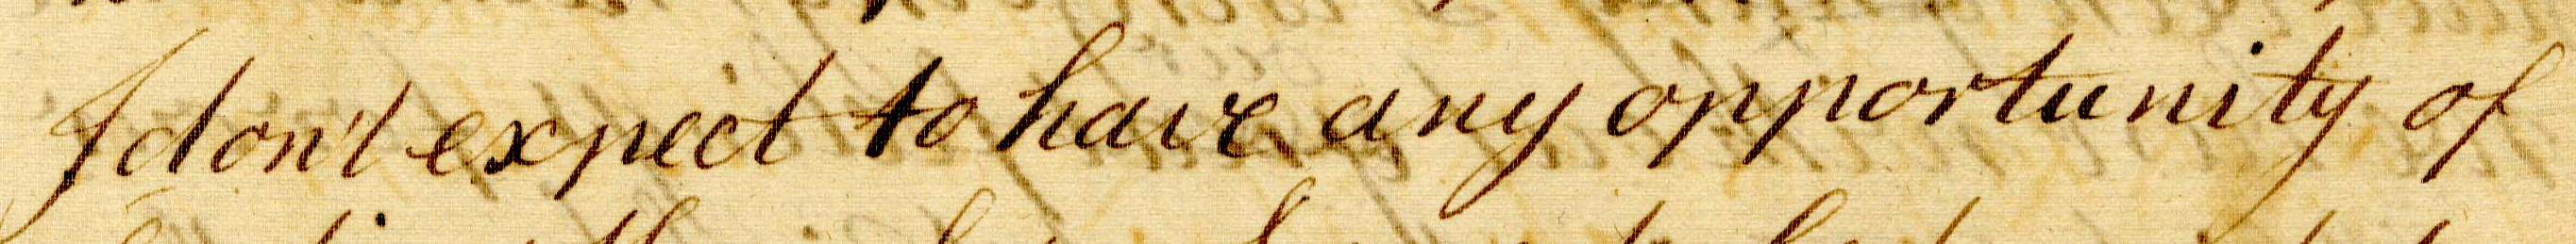I don't expect to have any opportunity of
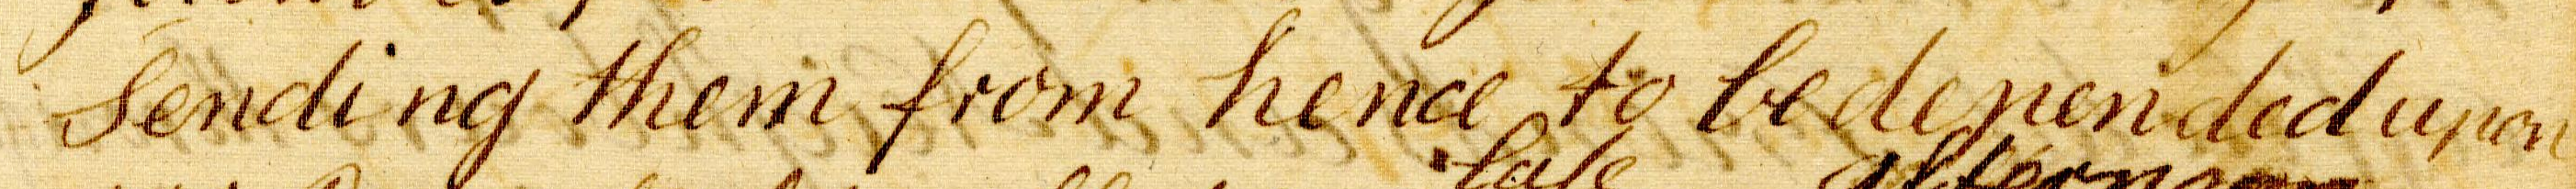sending them from hence to be depended upon
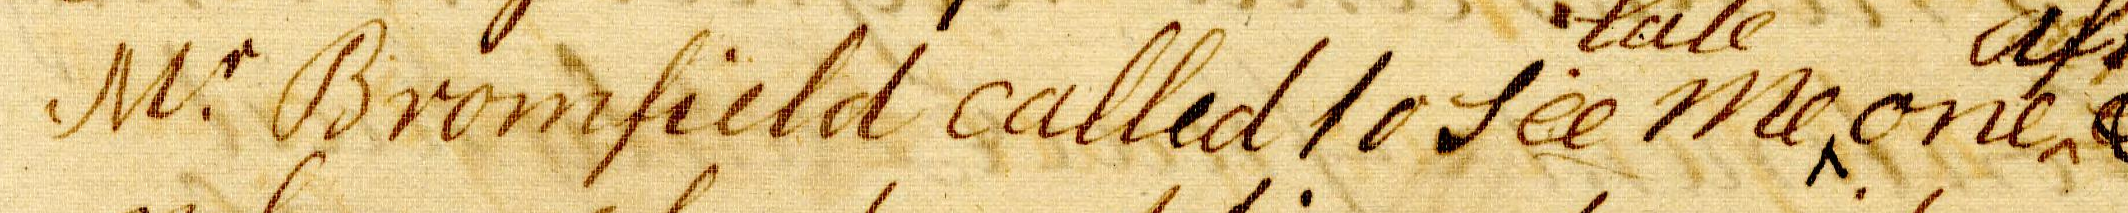M^r. Bromfield called to See Me ^ one ^
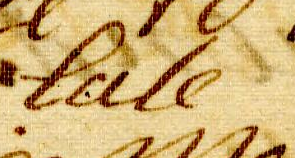late
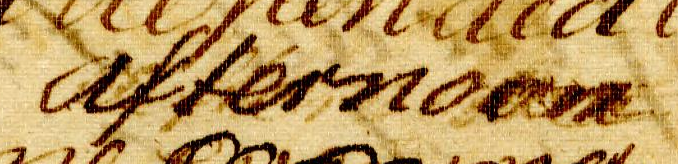Afternoon
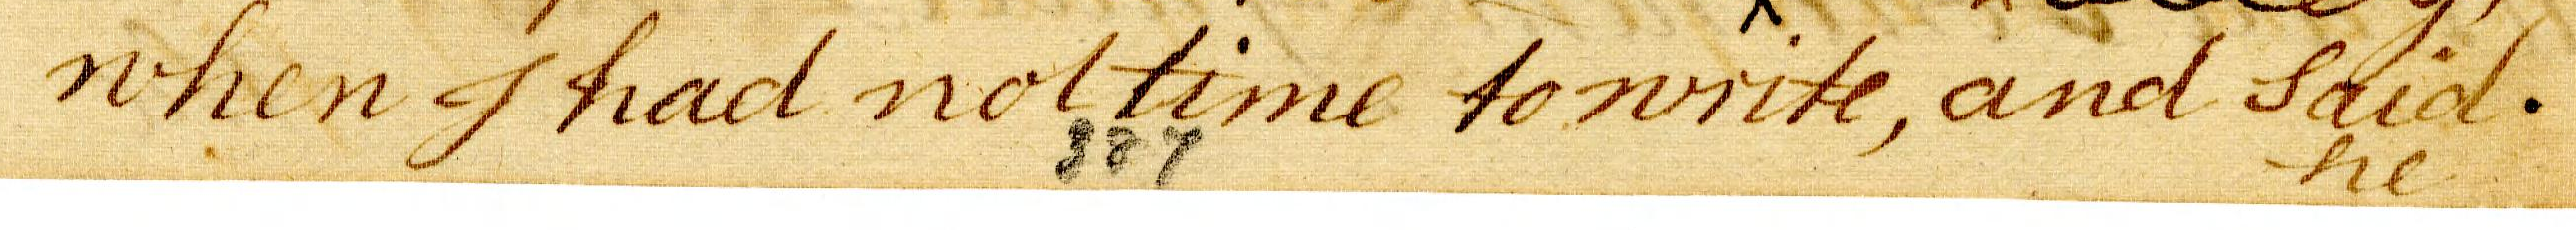when I had not time to write, and Said
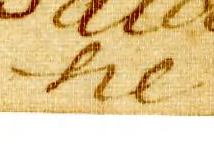he
